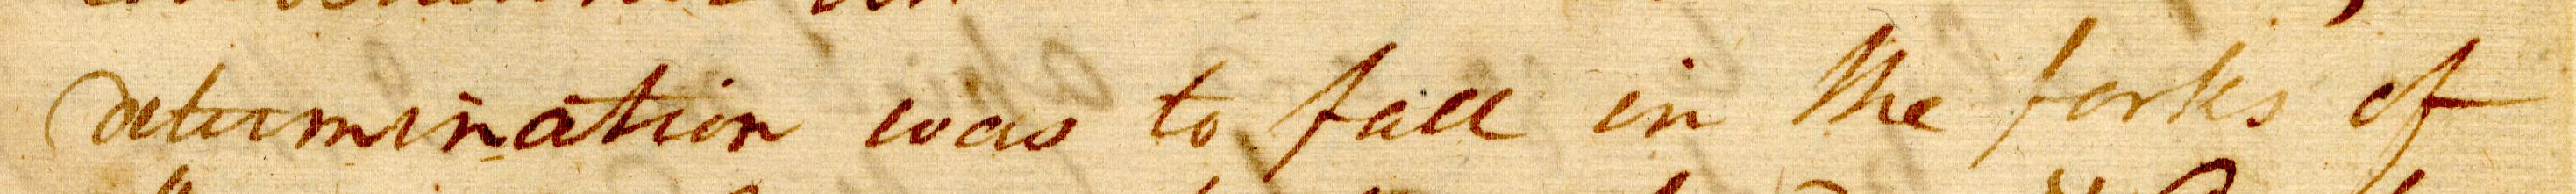determination was to fall in the forks of
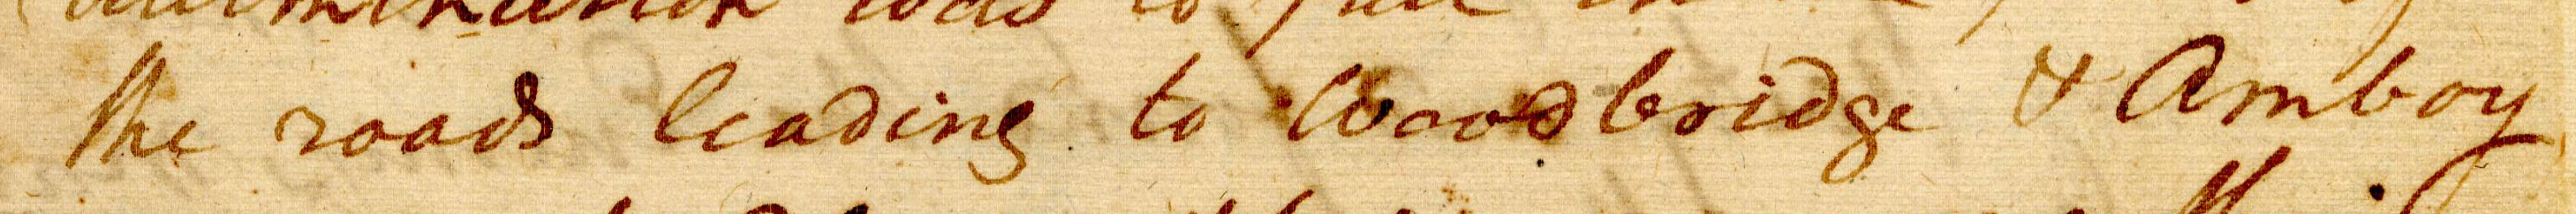the roads leading to Woodbridge & Amboy
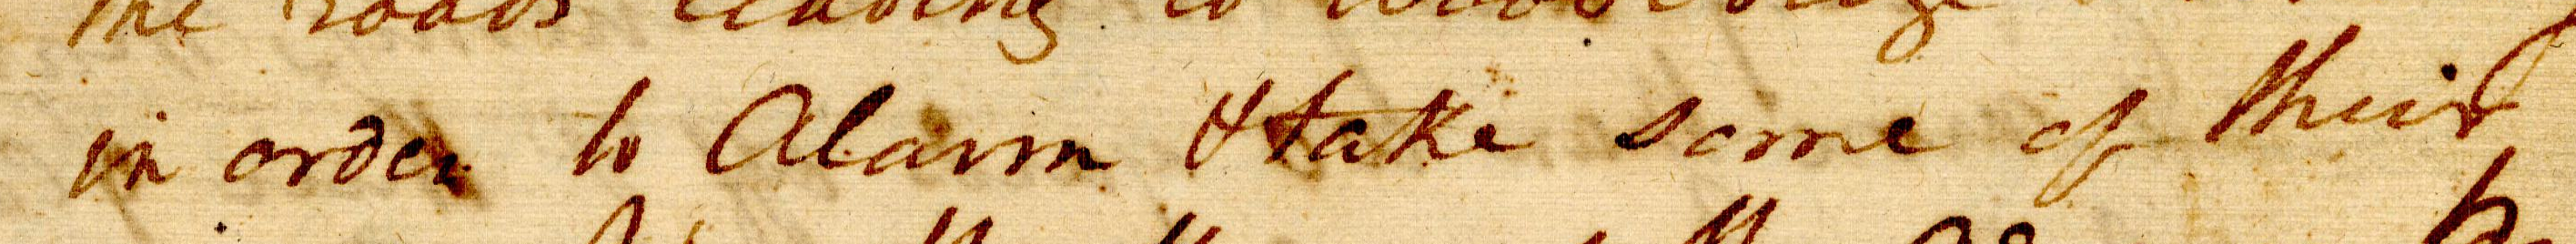in order to Alarm & take some of their
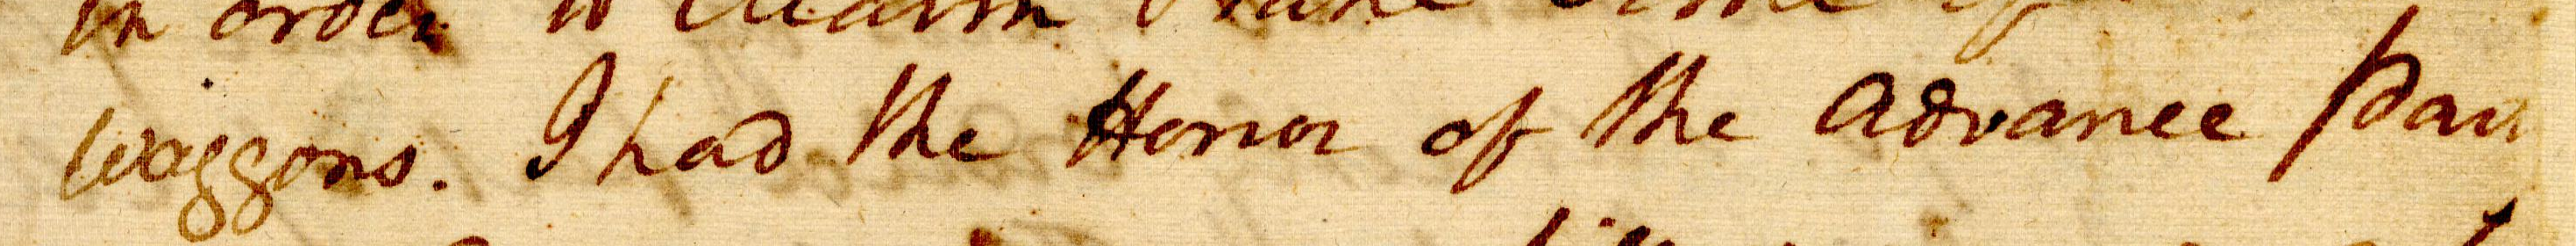Waggons. I had the Honor of the Advance Part
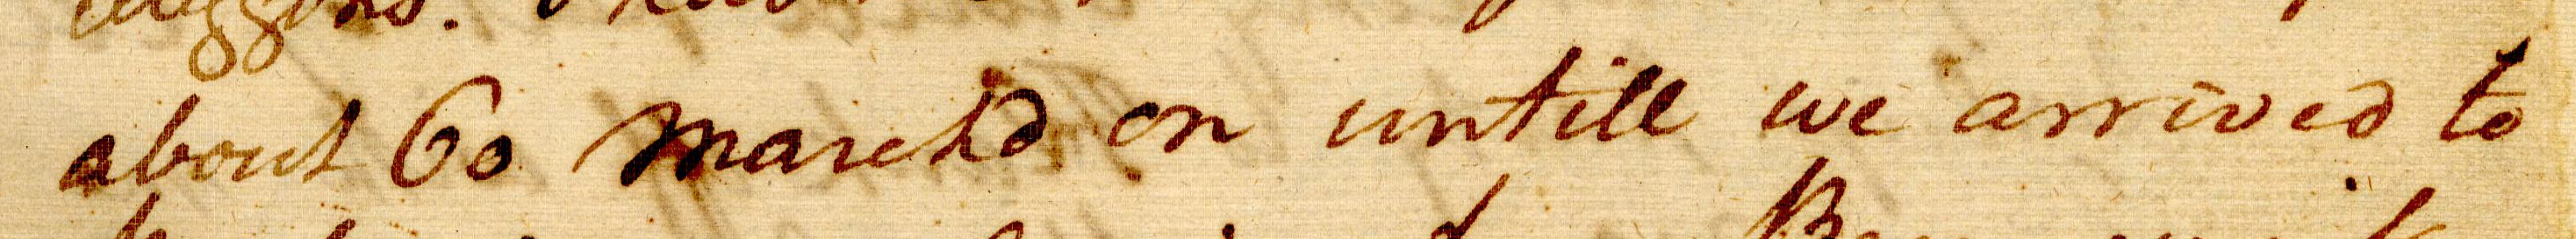about 60 marchd on untill we arrived to
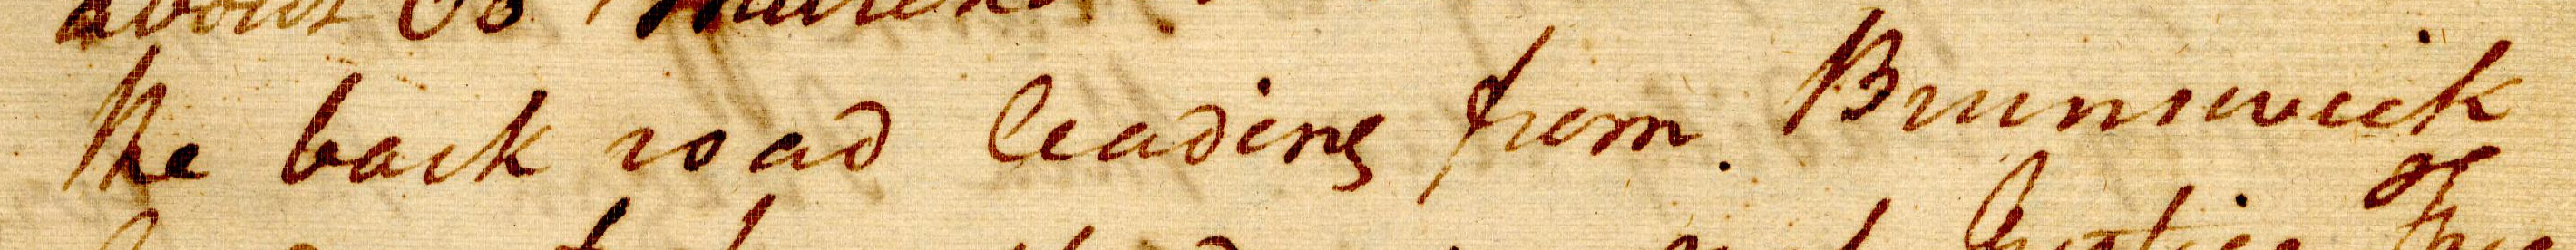the back road leading from Brunswick
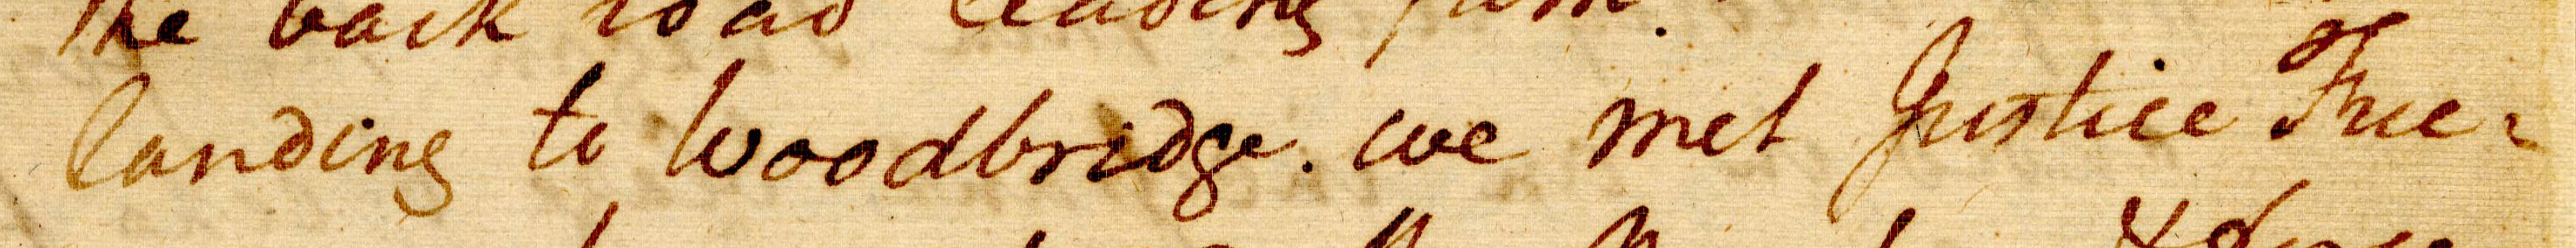landing to Woodbridge. we met Justice Free-
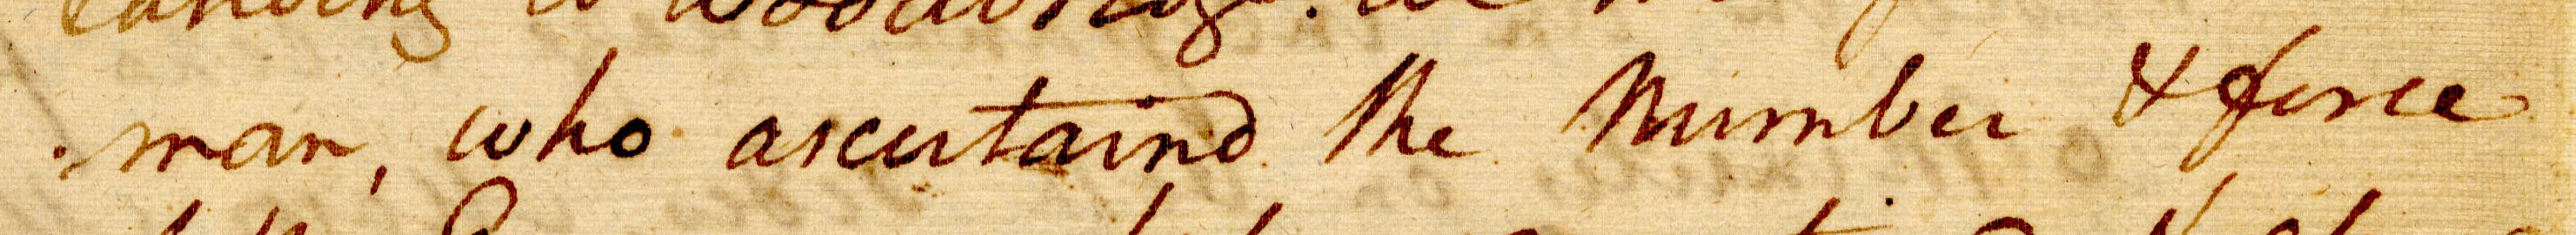-man, who ascertaind the Number & force
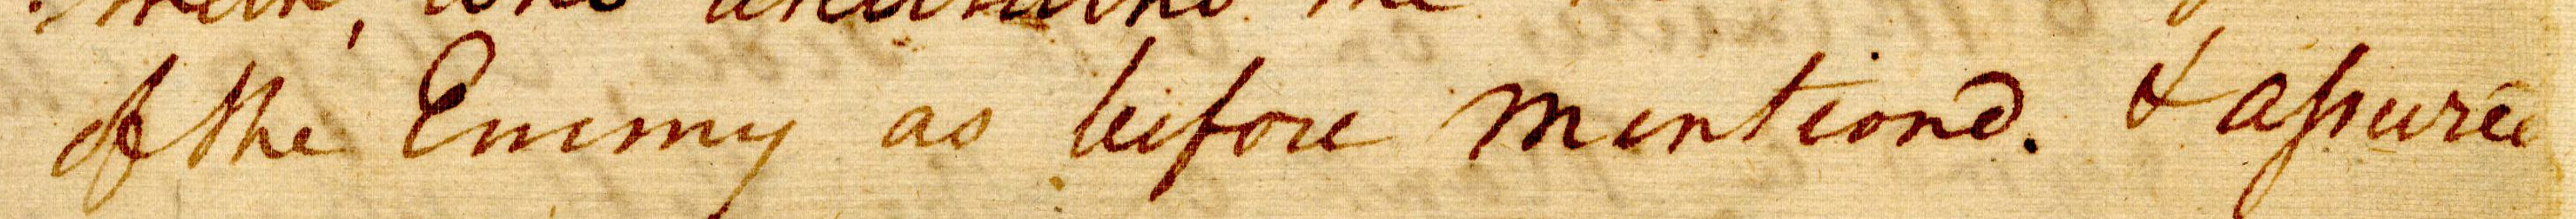of the Enemy as before mentiond. & assured
